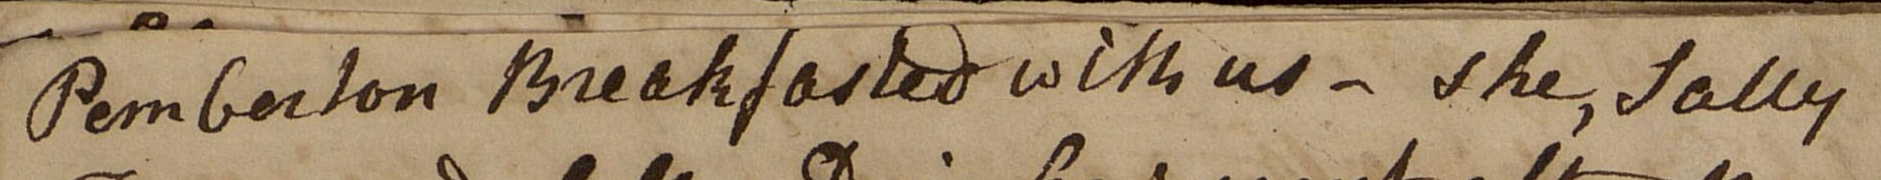Pemberton Breakfasted with us- she, Sally
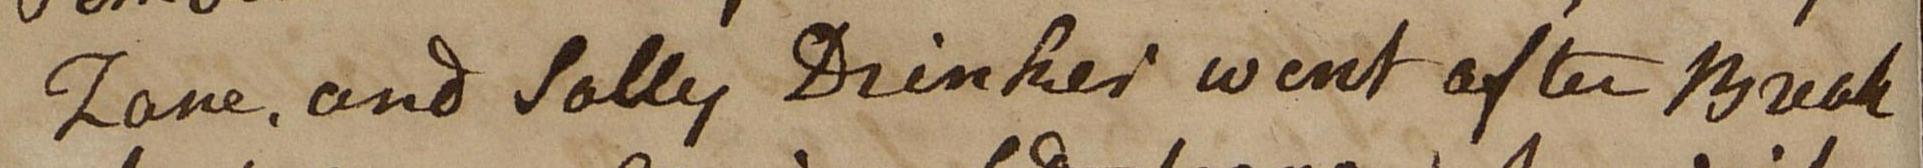Zane, and Sally Drinker went after Break
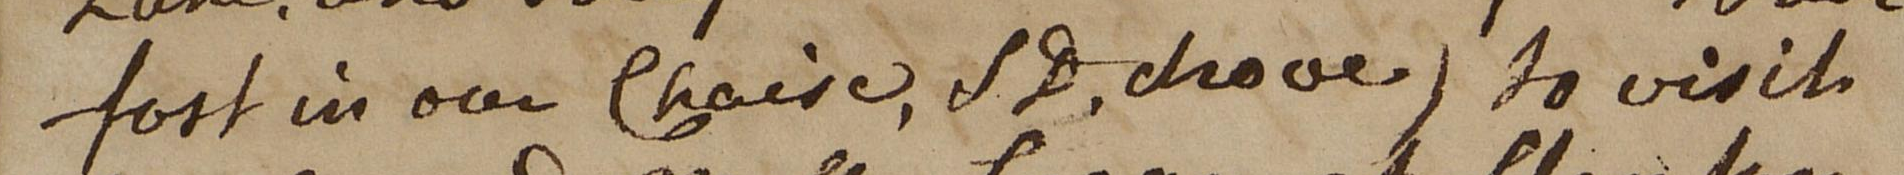-fast in our Chaise, SD, drove) to visit
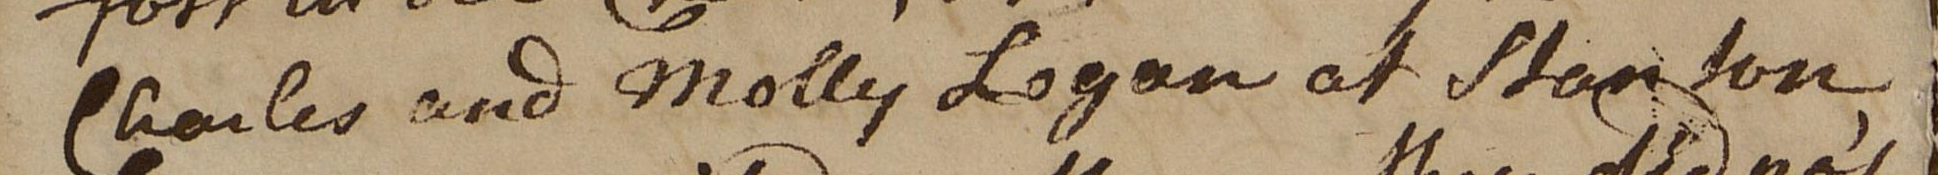Charles and Molly Logan at Stanton
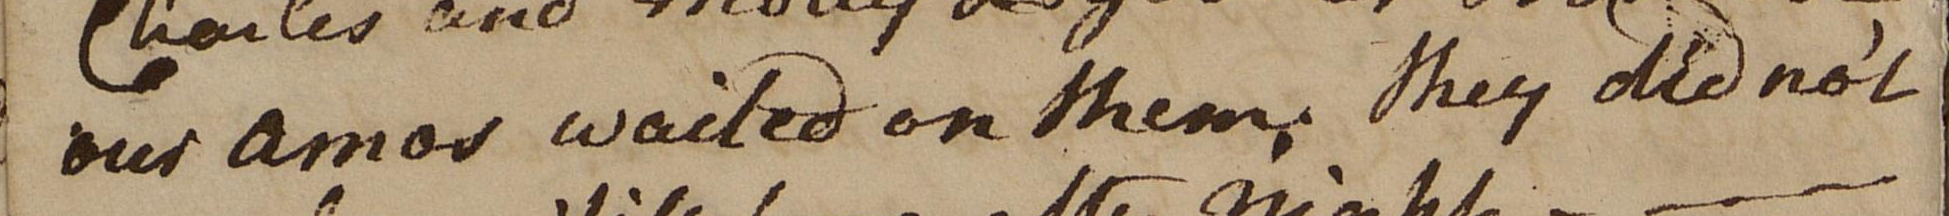our Amos waited on them; they did not
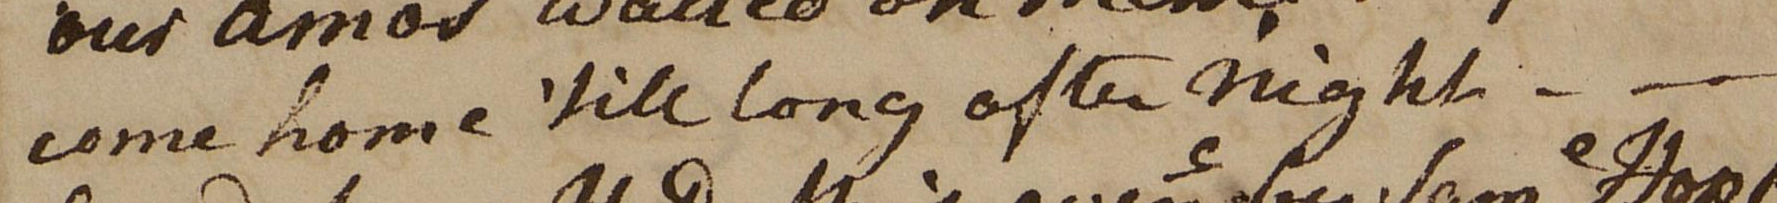come home 'till long after Night--
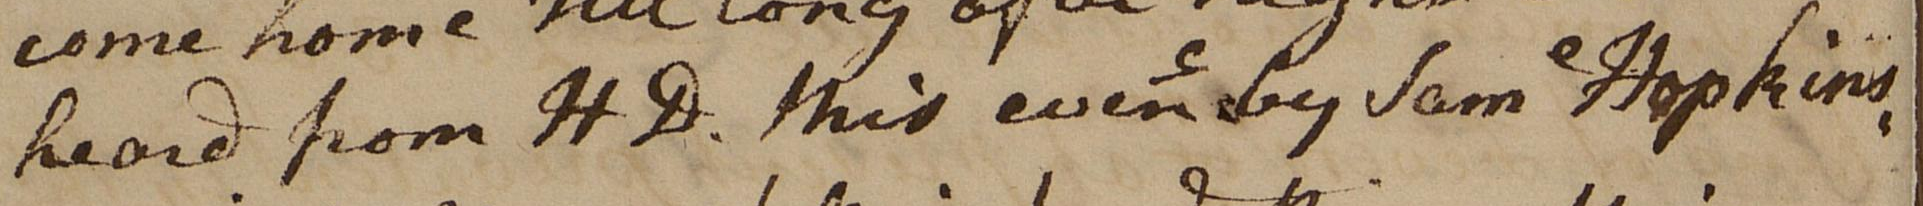heard from H D. this even^g by Sam^l Hopkins
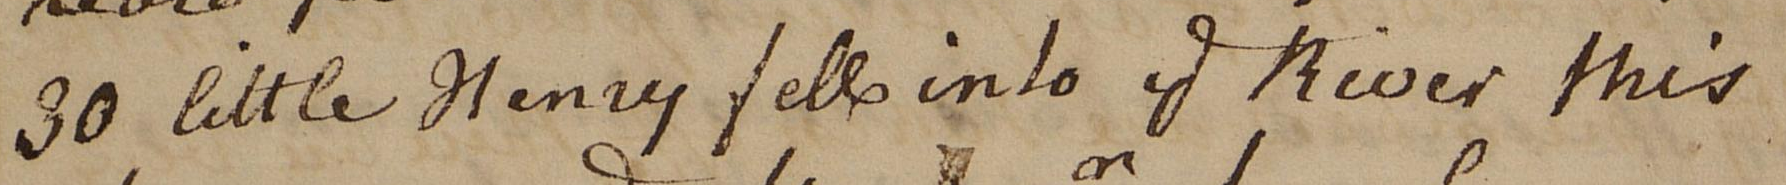30 little Henry fell into y^e River this
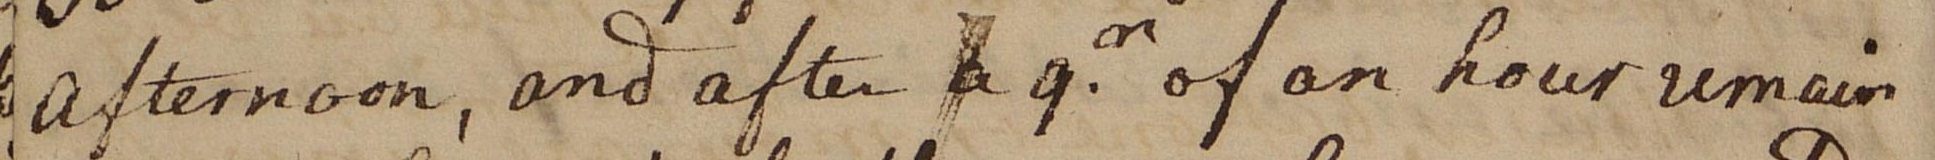afternoon, and after a q^r. of an hour remain
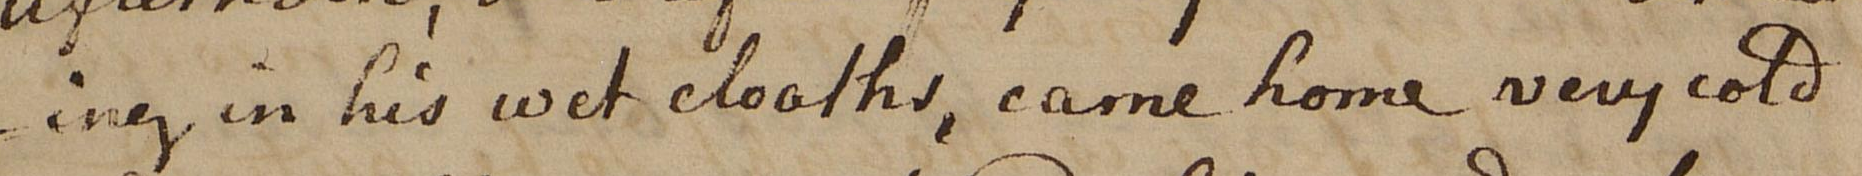-ing in his wet cloaths, came home very cold
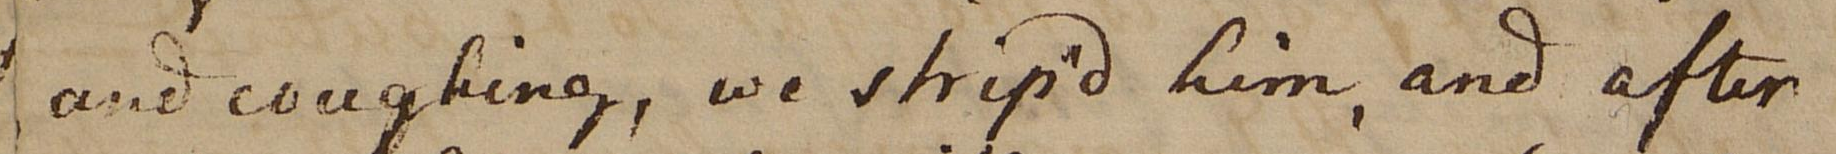and coughing, we strip'd him and after
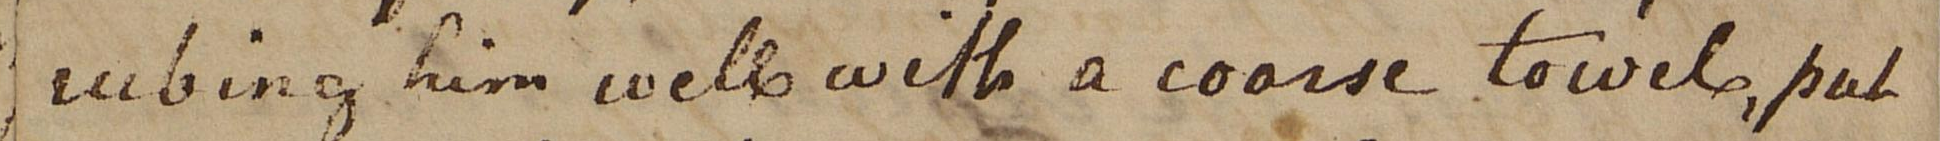rubing him well with a coarse towel, put
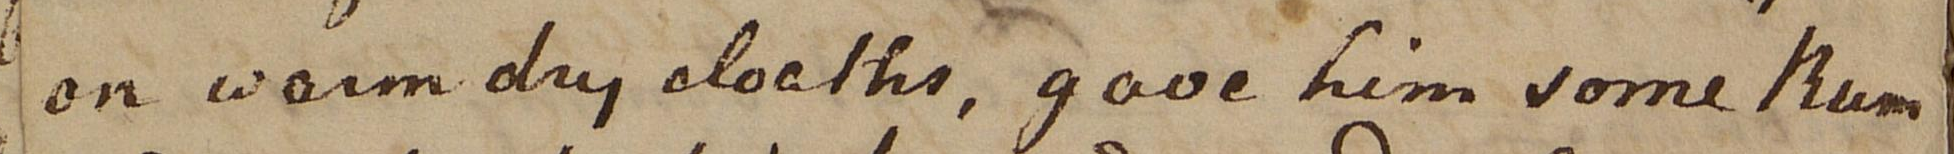on warm dry cloaths, gave him some Rum
